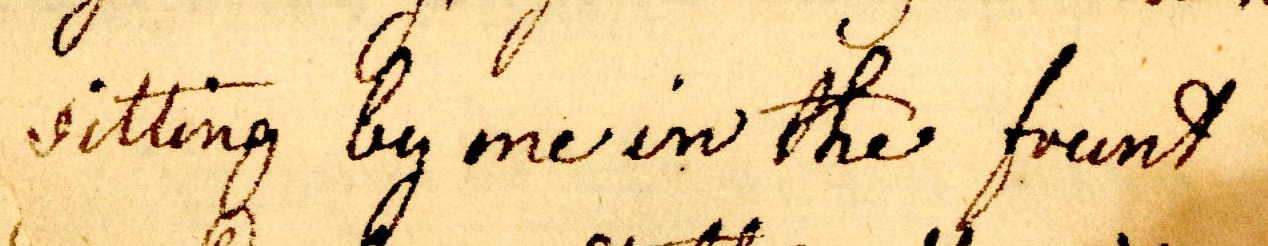sitting by me in the frunt
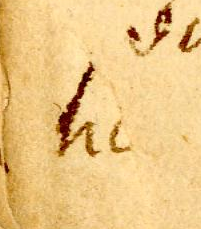he
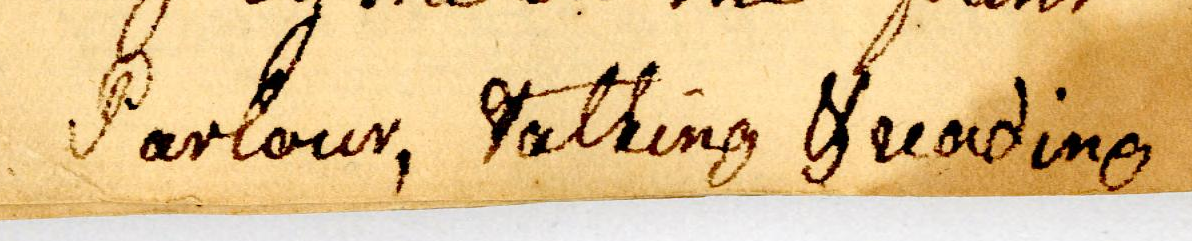Parlour, talking & reading
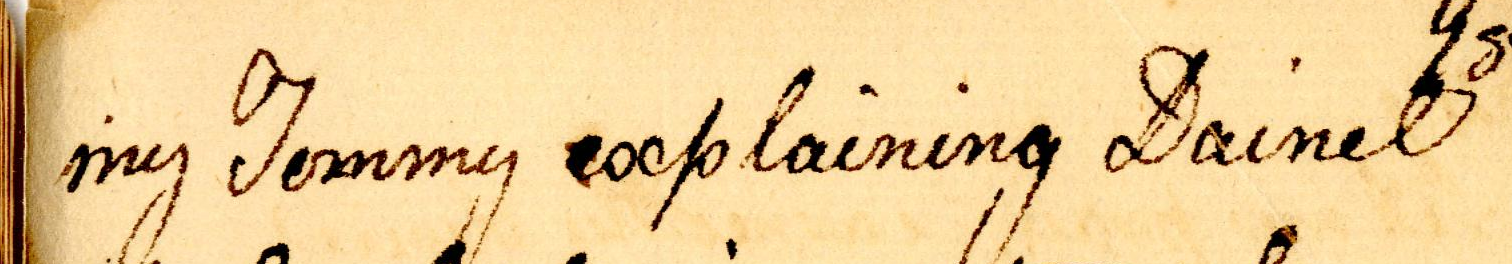my Tommy explaining Dainel
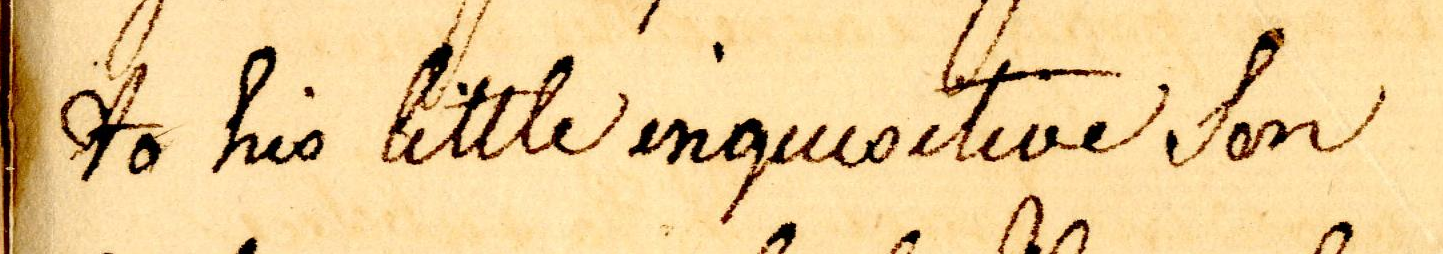to his little inquisitive Son
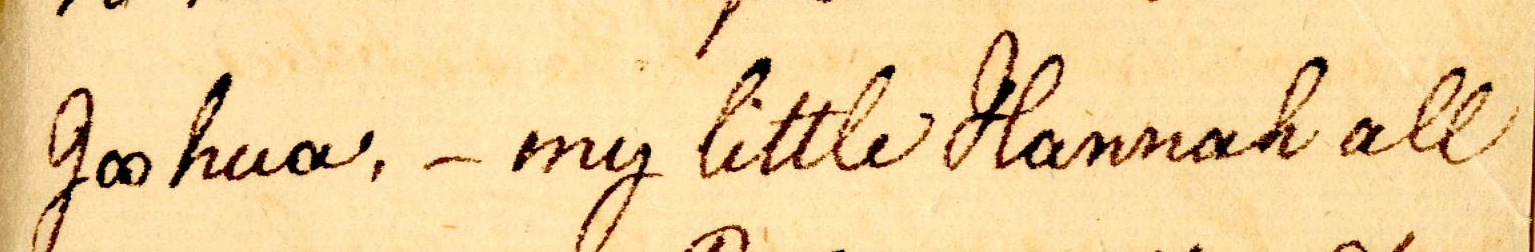Joshua,- my little Hannah all
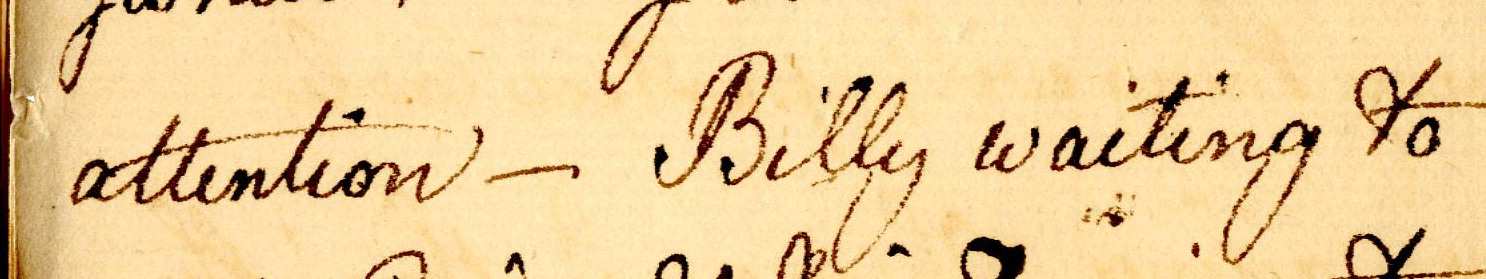attention- Billy waiting to
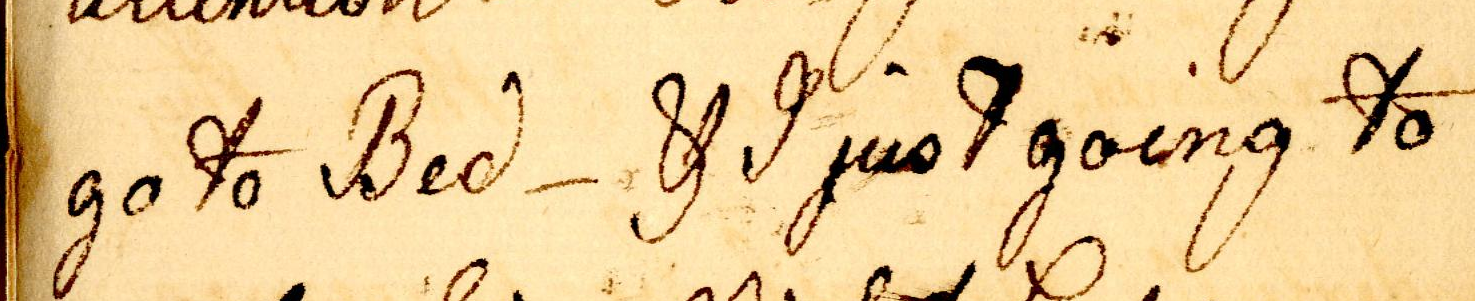go to Bed- & I just going to
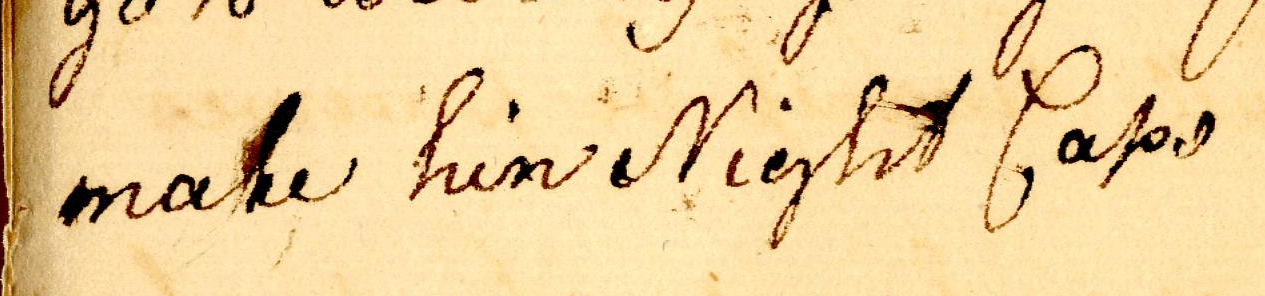make him Night Caps
